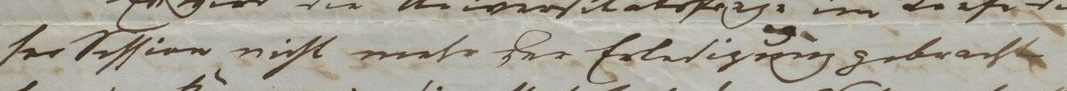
ser Session nicht mehr zur Erledigung gebracht
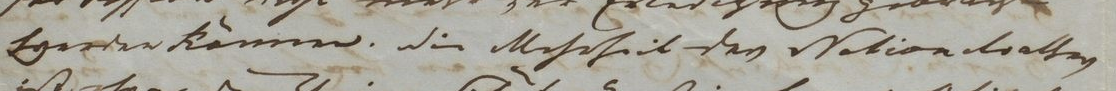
werden können. Die Mehrheit des Nationalrathes
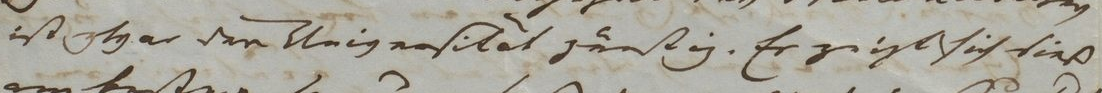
ist zwar der Universität günstig. Es zeigt sich dieß
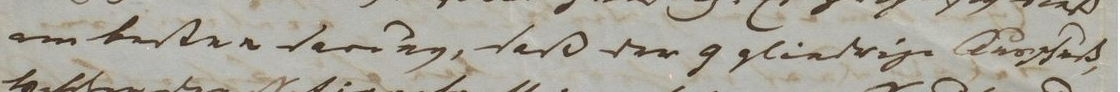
am besten daran, daß der 9gliedrige Ausschuß,
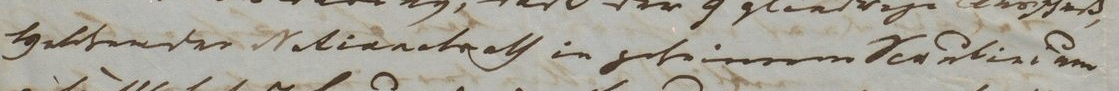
welchen der Nationalrath in geheimem Scrutinium
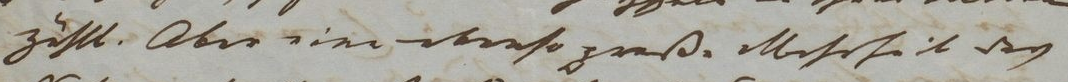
zählt. Aber eine ebenso große Mehrheit des
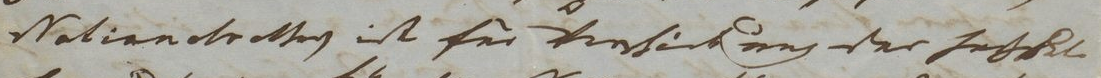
Nationalrathes ist für Verschiebung der Hochschul-
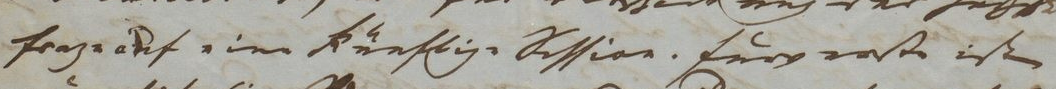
frage auf eine künftige Session. Fürs erste ist
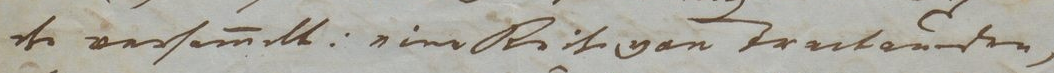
che versammelt: eine Reihe von Tractanden,
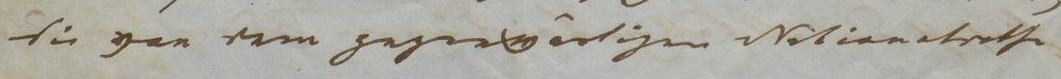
die von dem gegenwärtigen Nationalrathe
